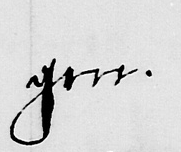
gen.
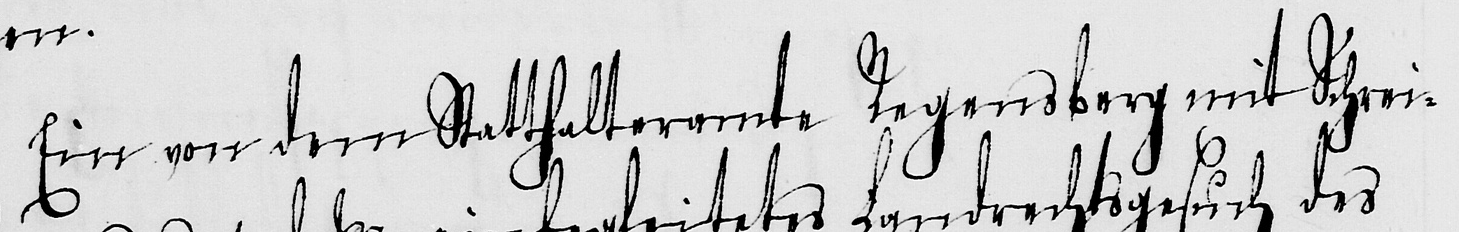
Ein von dem Statthalteramte Regensberg mit Schrei¬
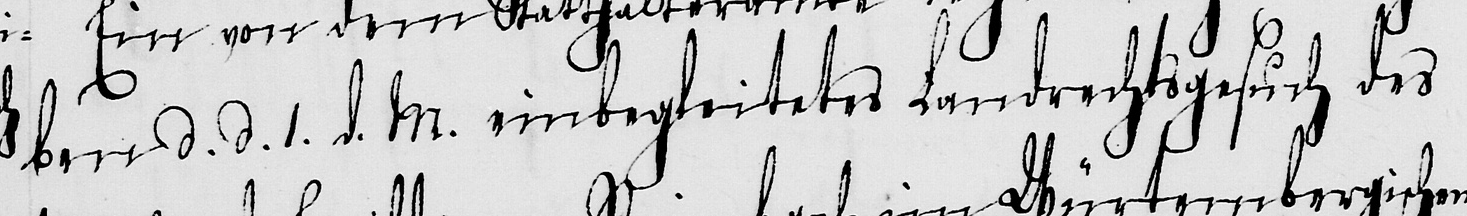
ben d. d. 1. d. M. einbegleitetes Landrechtsgesuch des
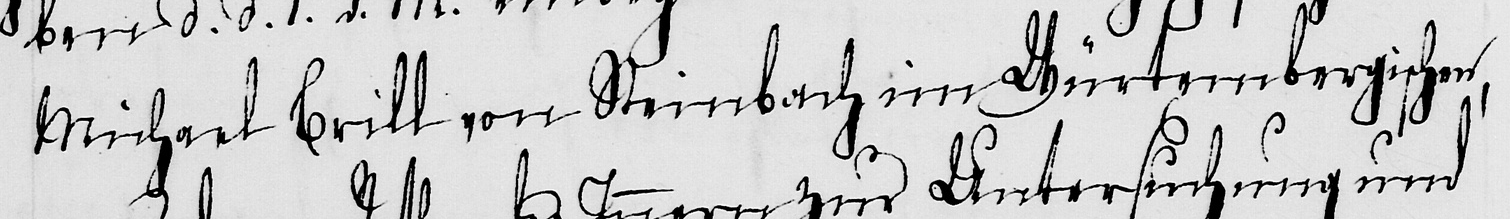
Michael Brill von Steinbach im Würtembergischen,
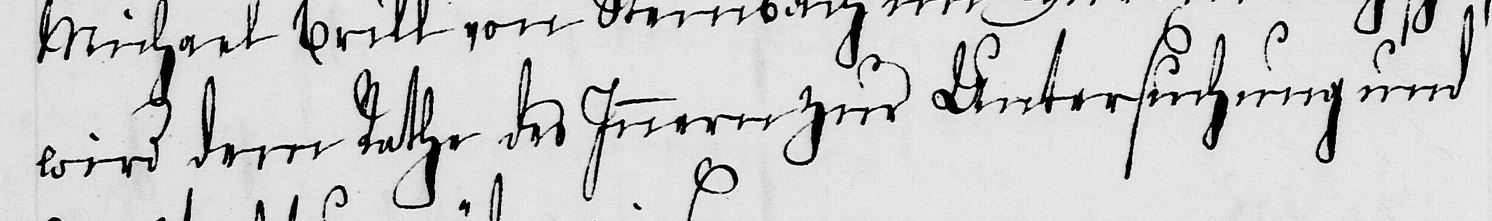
wird dem Rathe des Innern zur Untersuchung und
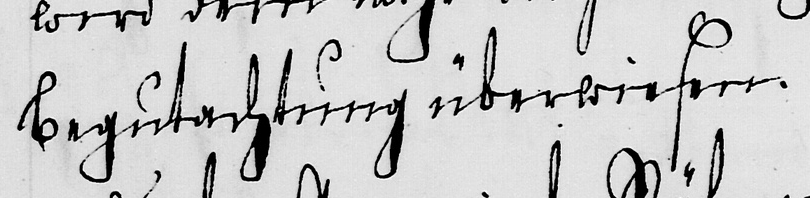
Begutachtung überwiesen.
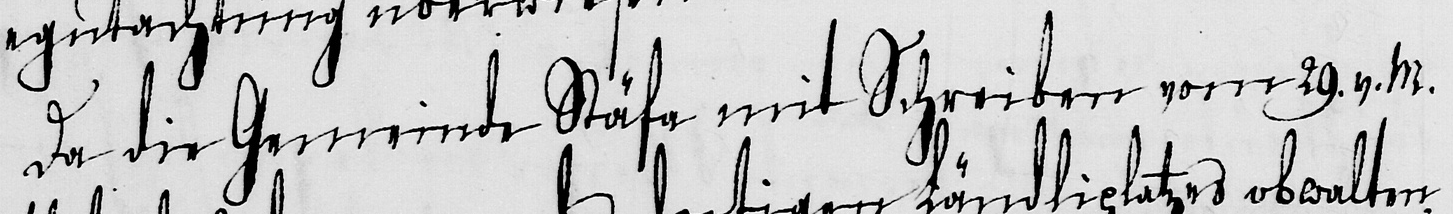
Da die Gemeinde Stäfa mit Schreiben vom 29. v. M.
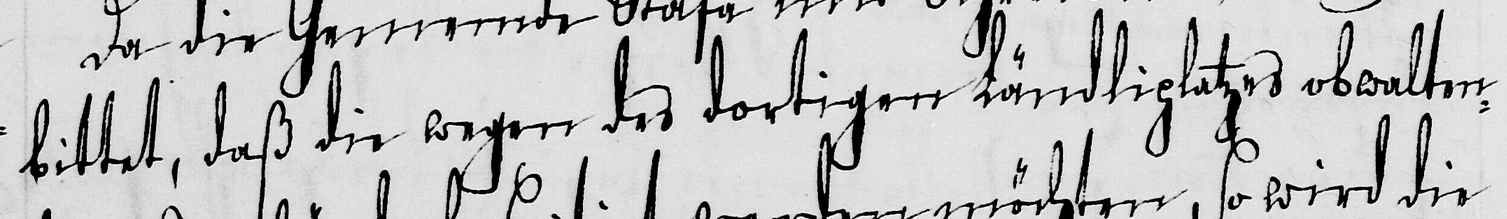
bittet, daß die wegen des dortigen Ländliplatzes obwalten¬
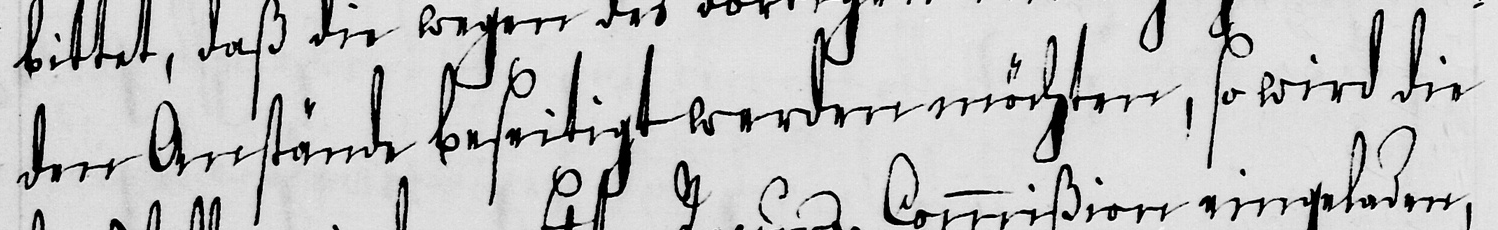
den Anstände beseitigt werden möchten, so wird die
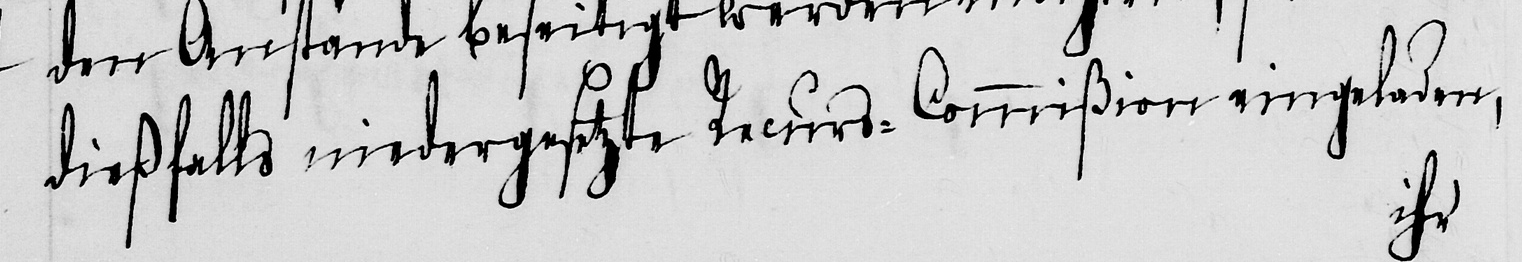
dießfalls niedergesetzte Recurs-Commißion eingeladen,
